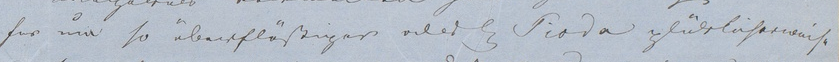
für um so überflüßiger als Herr Pioda glüklicherweise
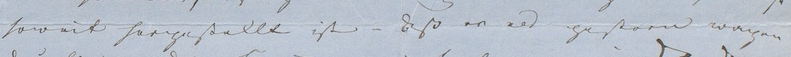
soweit hergestellt ist – daß er es gestern wagen
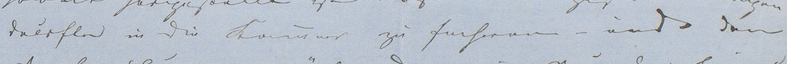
durfte in die Kammer zu fahren – und den
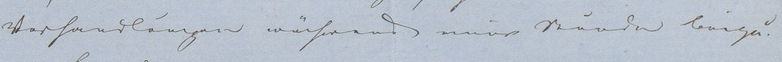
Verhandlungen während einer Stunde beizu-
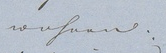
wohnen.
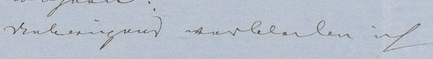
Uebrigens verbleibe ich
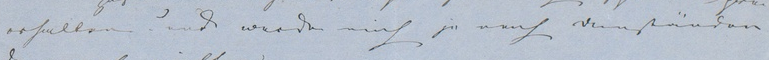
erhalten und werde mich je nach Umständen
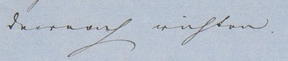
darnach richten. –
